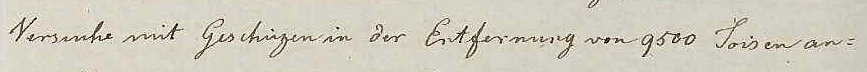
Versuche mit Geschüzen in der Entfernung von 9500 Toisen an-
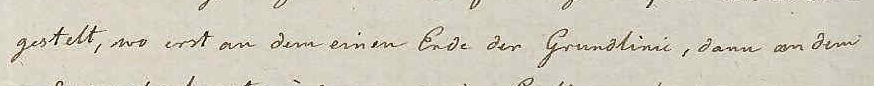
gestelt, wo erst an dem einen Erde der Grundlinie, dann an dem
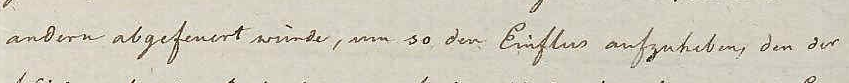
andern abgefeuert würde, um so den Einflus aufzuheben, den der
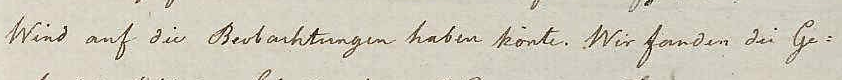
Wind auf die Beobachtungen haben könte. Wir fanden die Ge-
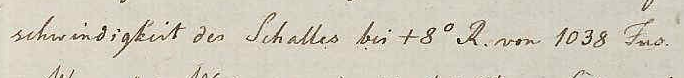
schwindigkeit des Schalles bei +8° R. von 1038 Fus.
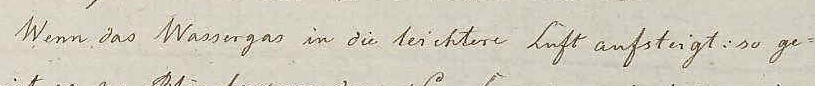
Wenn das Wassergas in die leichtere Luft aufsteigt: so ge-
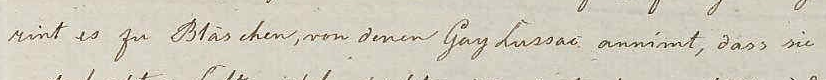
rint es zu Bläschen, von denen Gay Lussac annimt, dass sie
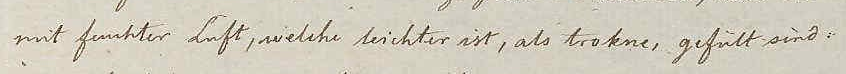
mit feuchter Luft, welche leichter ist, als trokne, gefült sind:
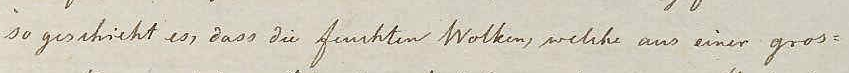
so geschieht es, dass die feuchten Wolken, welche aus einer gros-
